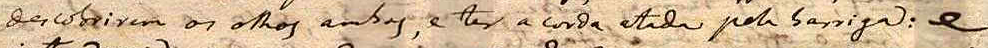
descobrirem os olhos ambos, e ter a corda atada pela barriga: e
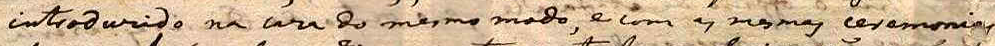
introduzido na caza do mesmo modo, e com as mesmas ceremonias
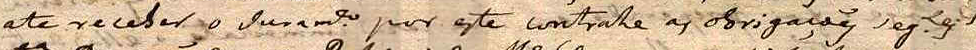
ate receber o Iuram.to por este contrahe as obrigaçoẽs seg.tes
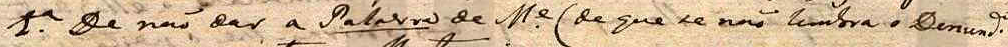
1.a de naõ dar a Palavra de M.e (de que se naõ lembra o Denund.o)
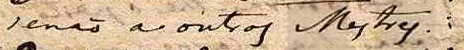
senaõ a outros Mestres:
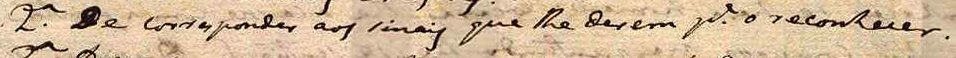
2.a De corresponder aos sinais que lhe derem p.a o reconhecer.
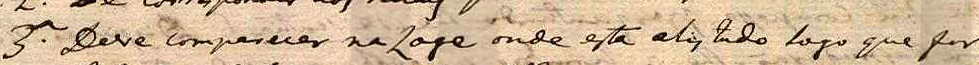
3.o Deve comparecer na Loge onde esta alistado logo que for
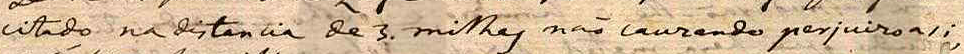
citado na distancia de 3. milhas naõ cauzando perjuizo a si,
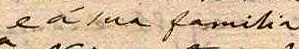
e á sua familia
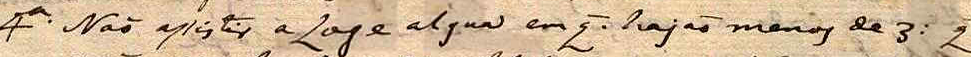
4.a Naõ assistir a Loge alguā em q̄ hajaõ menos de 3: q̄
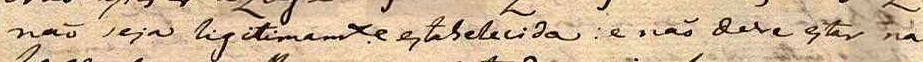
naõ seja ligitimam.te estabelecida; e naõ deve estar na
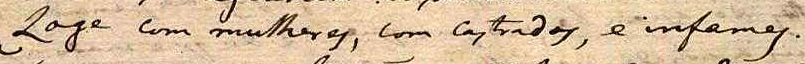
Loge com mulheres, com castrados, e infames.
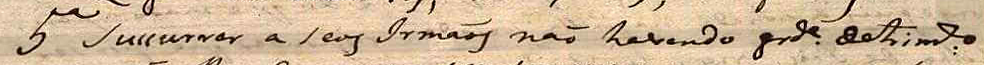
5 Succurrer a seos Irmaõs naõ havendo gr.de detrim.to
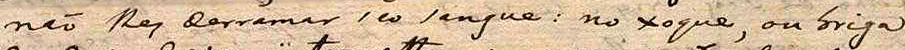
naõ lhes derramar seo sengue: no xoque, ou briga
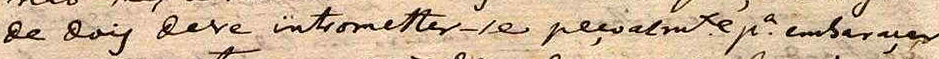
de dois deve intrometter-se peçoalm.te p.a embaraçar
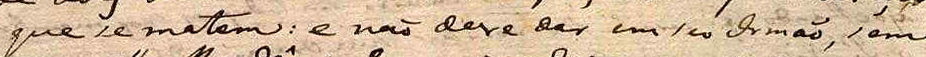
que se matem: e naõ deve dar em seo Irmaõ, sem
